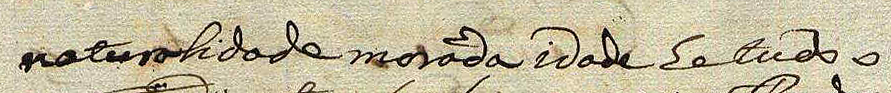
naturalidade morada idade he tudo o
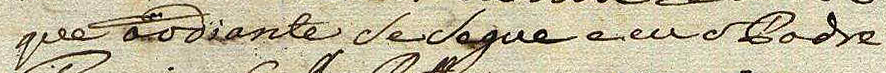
que aodiante se segue e eu o Padre
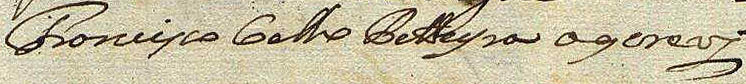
Francisco Coelho Petteyra o escrevj
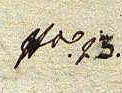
tta. i3.
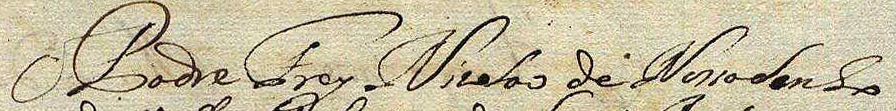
Padre Frey. Nicolao de Nossa Senho
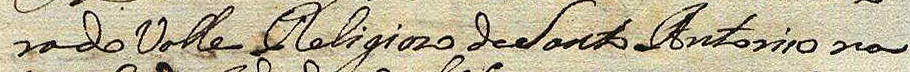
ra do Valle Religiozo de Santo Antonio na
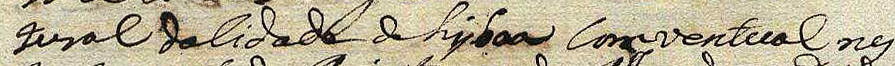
tural da Cidade de Lisboa Comventual nes
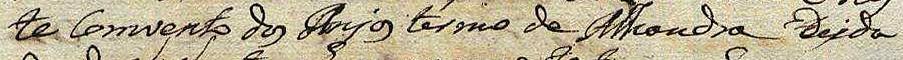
te Comvento dos Anjos termo de Alhandra de jda
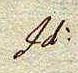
Jd:
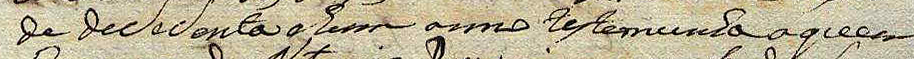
de de sesenta e hum anno testemunha a quem
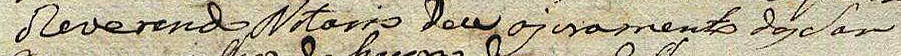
Reverendo Notario deu o juramento dos San
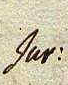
Jur:
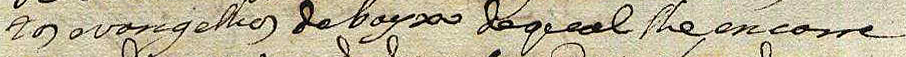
tos evangelhos debayxo do qual lhe encarre
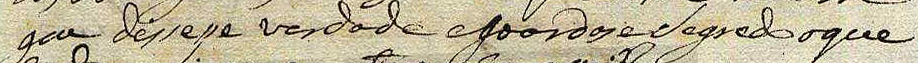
gou dissesse verdade e goardase segredo o que
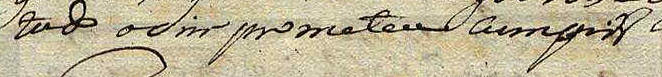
tudo asim prometeu cumprir
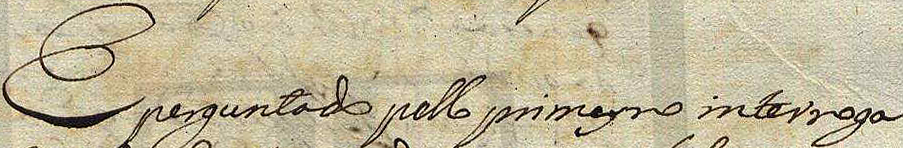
E perguntado pello primeyro interroga
